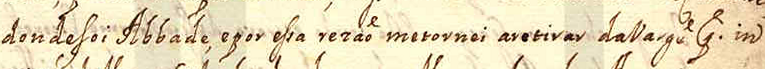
donde foi Abbade, e por essa rezaõ me tornei a retirar da Vargē p̄ in
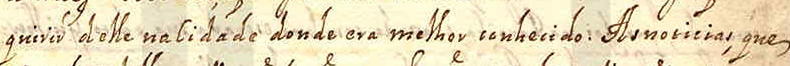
quirir delle na Cidade donde era melhor conhecido. As noticias, que
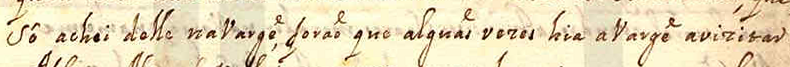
só achei delle na Vargē, foraõ que alguās vezes hia a Vargē a vizitar
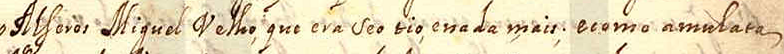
o Alferes Miguel Velho, que era seo tio, e nada mais; e como a mulata
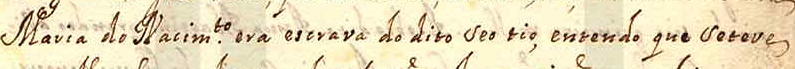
Maria do Nacim.to era escrava do dito seo tio, entendo que se teve
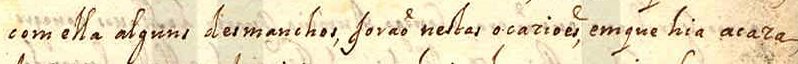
com ella alguns desmanchos, foraõ nestas ocaziões, em que hia a caza
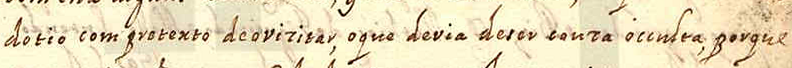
do tio com pretexto de o vizitar, o que devia de ser couza occulta, porque
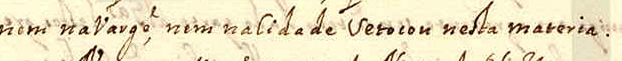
nem na Vargē, nem na Cidade se tocou nesta materia.
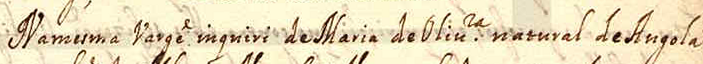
Na mesma Vargē inquiri de Maria de Oliu.ra natural de Angola
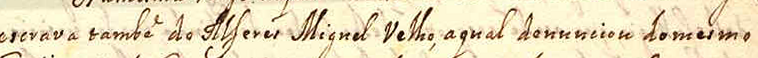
escrava tambē do Alferes Miguel Velho, a qual denunciou do mesmo
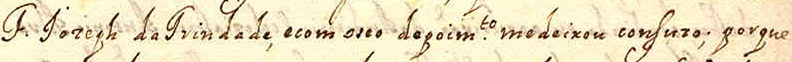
F. Iozeph da Trindade, e com o seo depoim.to me deixou confuzo; porque
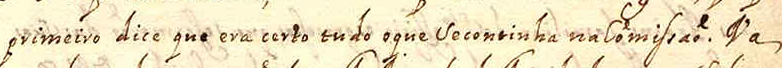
primeiro dice que era certo tudo o que se continha na Cōmissaõ. Va
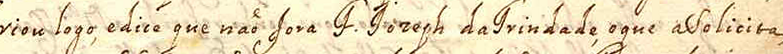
riou logo, e dice que naõ fora F. Iozeph da Trindade, o que a Solicita
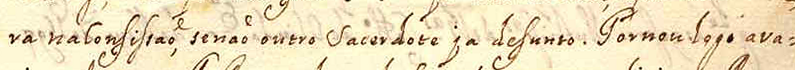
ra na Confissaõ, senaõ outro Sacerdote ja defunto. Tornou logo a va
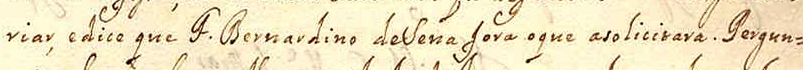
riar, e dice que F. Bernardino de Sena fora o que a solicitara. Pergun
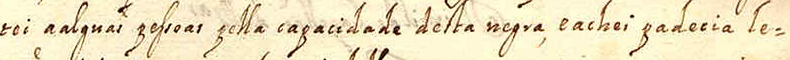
tei a alguās pessoas pella capacidade desta negra, e achei padecia le
